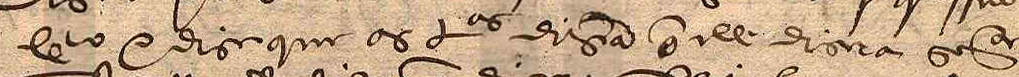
leo e dise que as tas diziā q̄ elle disera somte
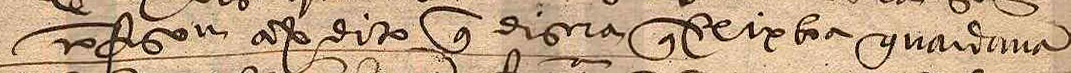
c̄ofesou aꝟ dito q̄ disera q̄ ē lixboa guardauā
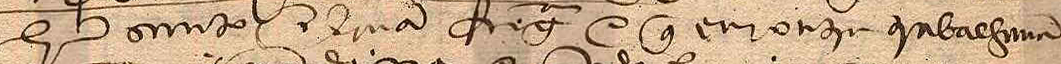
hū santo ē huā frega e q̄ em outra trabalhauā
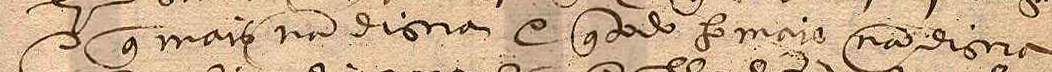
e q̄ mais nā disera e q̄ todo ho mais nā disera
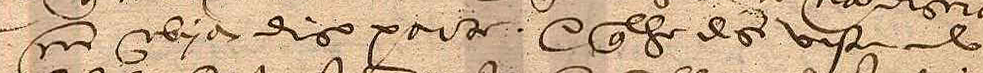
nē sabya diso parte. e q̄ lhe desē vista do
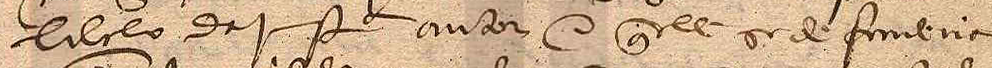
libelo da Justa autor e q̄ elle se defenderia
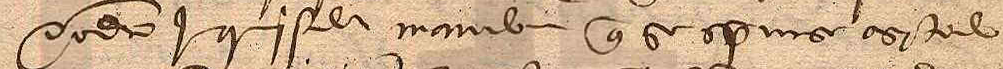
e o dt̄o Jnqujsidor mandou q̄ se sp̄uese asy todo
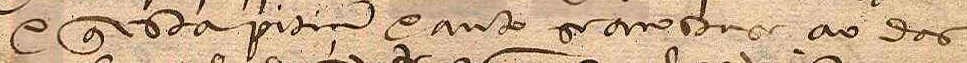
e q̄ esta pitiçā e auto se acostase ao das
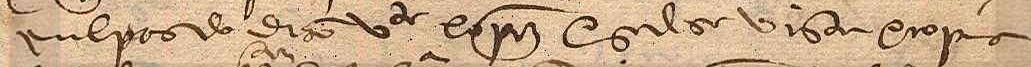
culpas do dito vte lopez e se dese vista e copia
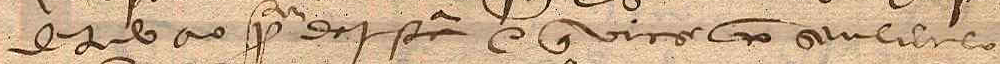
de tudo ao ꝓtor da Justa e q̄ viese c̄o seu libelo
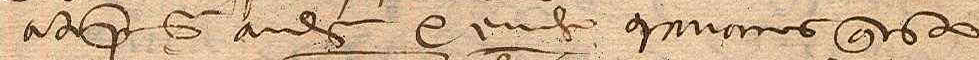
ate p̄mra audja e eu djo trauaços q̄ esto
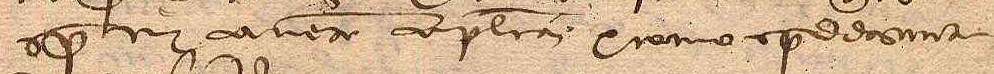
sp̄vy auc̄te ap̄lca e como esp̄uā da santa
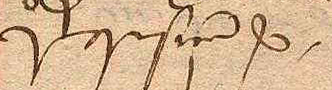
Jnqusiçā
